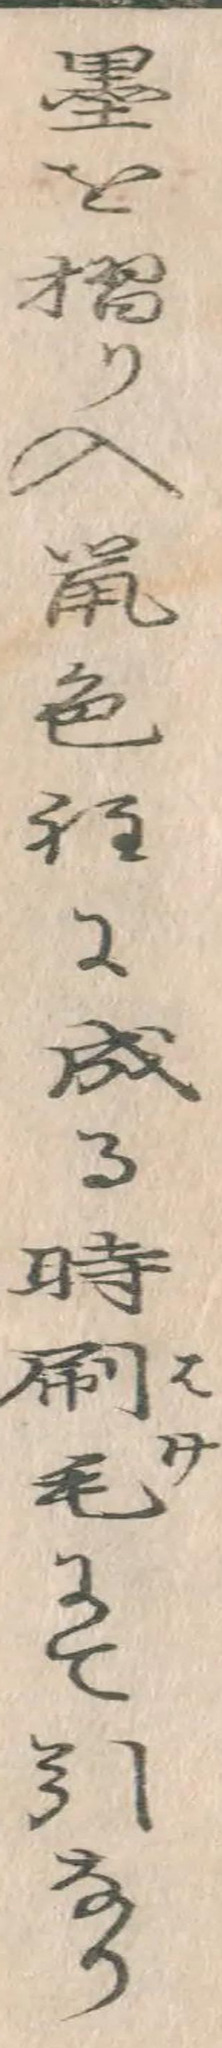墨を摺り入鼠色程に成る時刷毛にて引なり
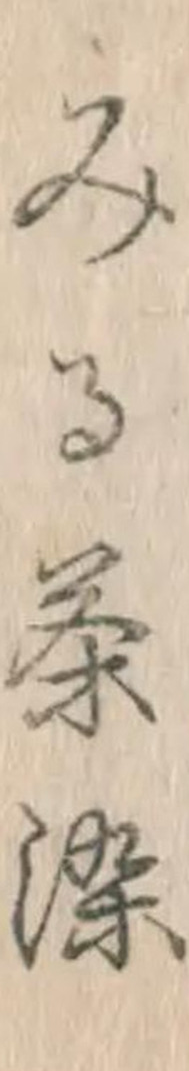みる茶染

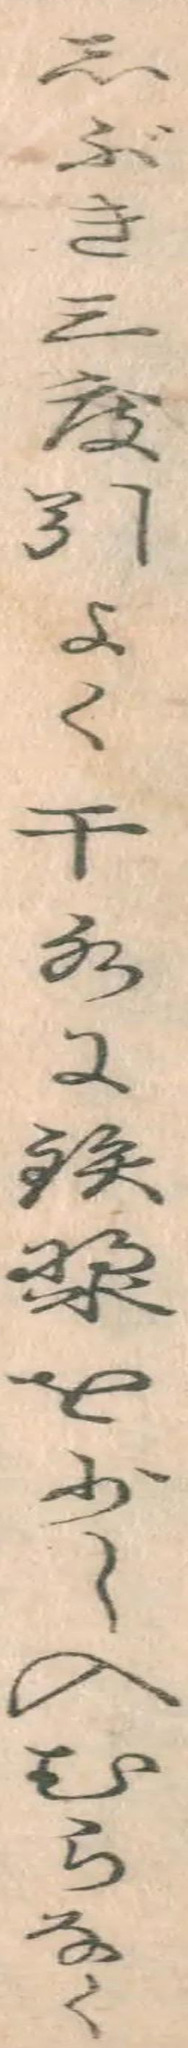しぶき三度引よく干水に鉄漿を少し入むらなく
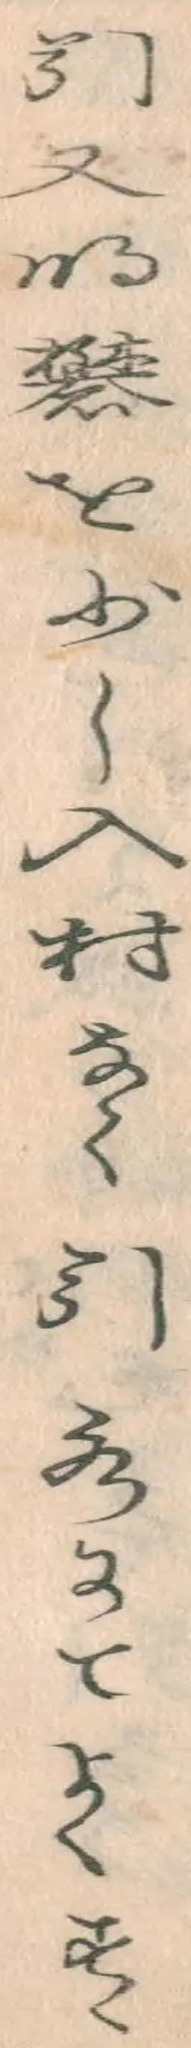引又明礬を少し入村なく引水にてよくすゝ
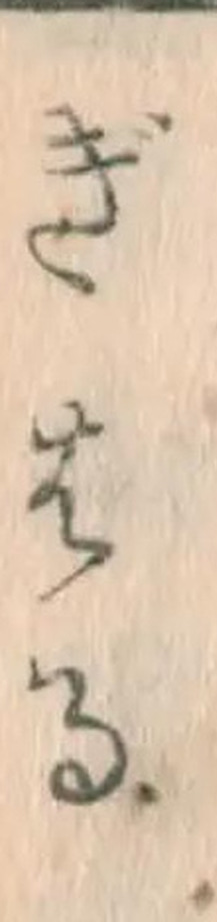ぎはる
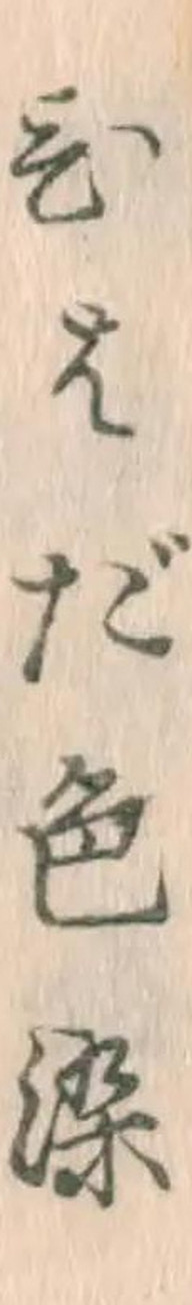ひはだ色染
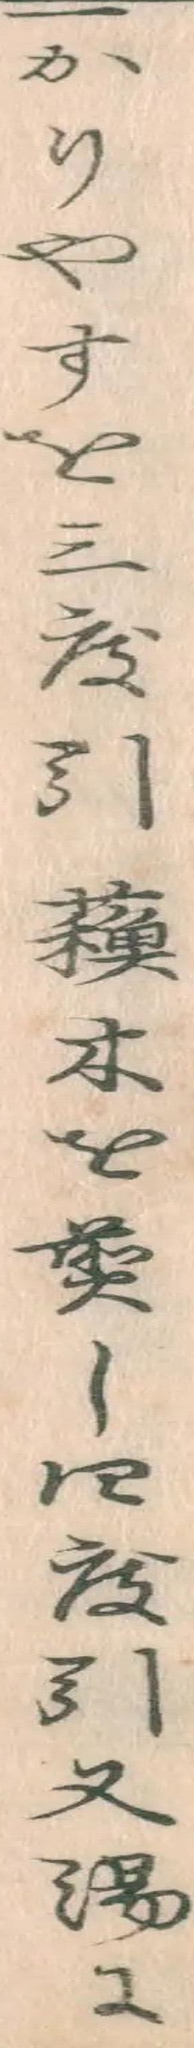一かりやすを三度引蘓木を煎し四度引又湯に
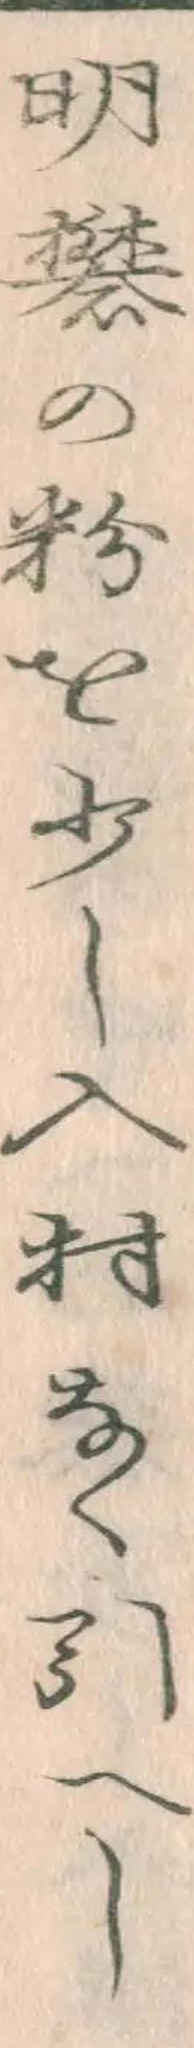明礬の粉を少し入村なく引へし
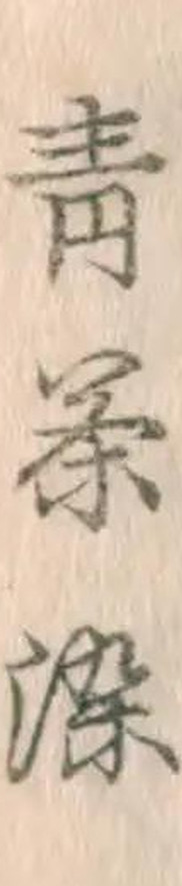青茶染
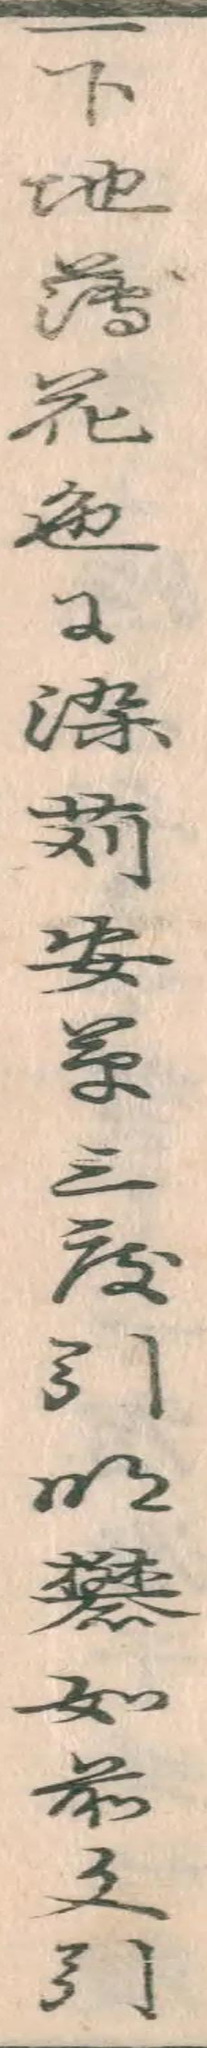一下地薄花色に染苅安草三度引明礬如前文引
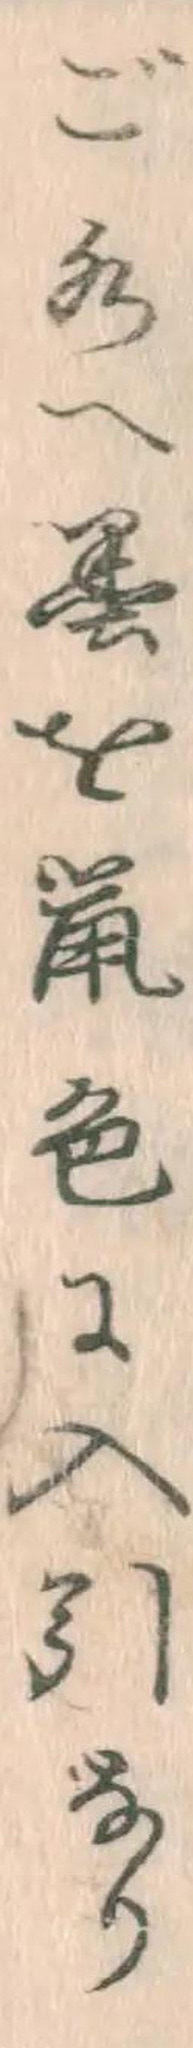ご水へ墨を鼠色に入引なり
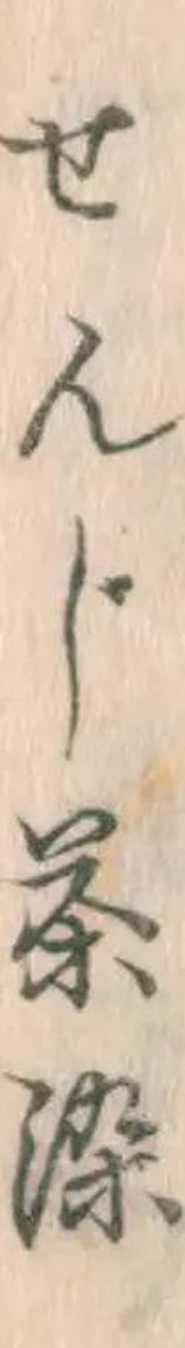せんじ茶染
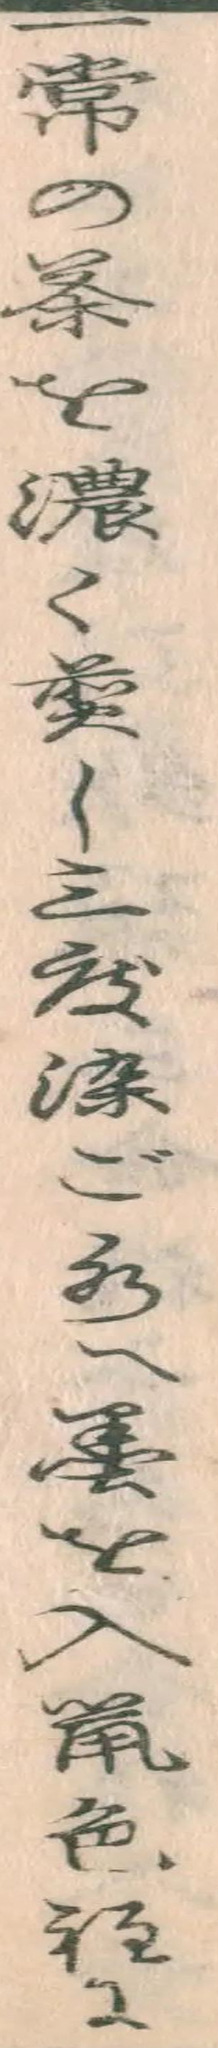一常の茶を濃く煎し三度染ご水へ墨を入鼠色程に
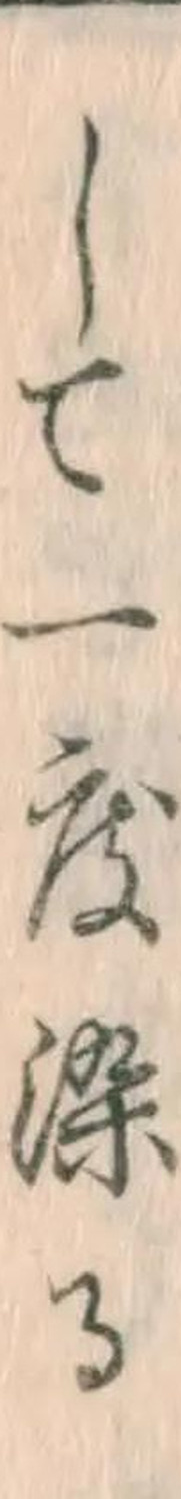して一度染る
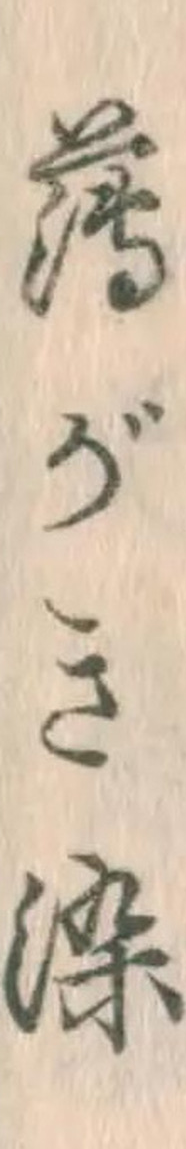薄がき染
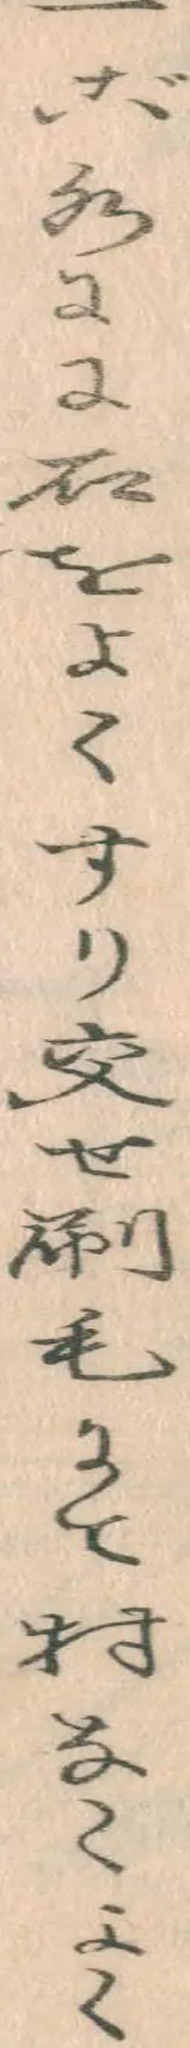一ご水にに石をよくすり交せ刷毛にて村なくよく
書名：機織彙編 5巻. [1]
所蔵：国立国会図書館 National Diet Library, JAPAN
